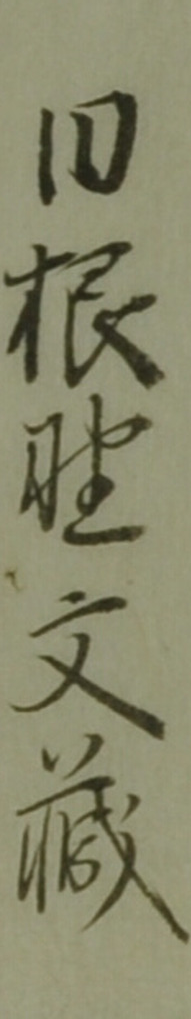日根野文蔵
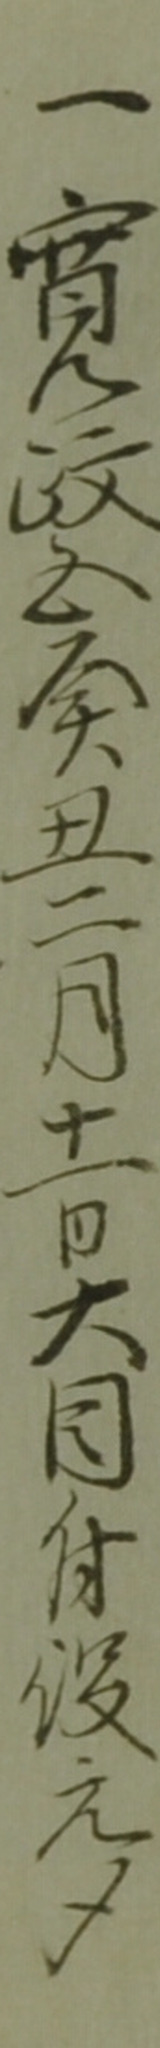一寛政五癸丑二月十一日大目付役元〆
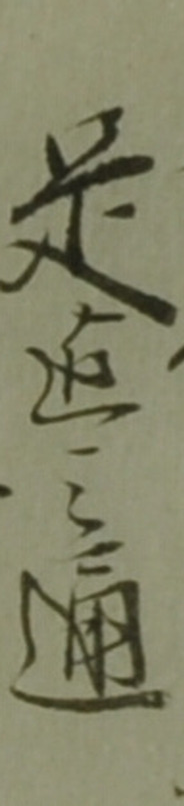是迄之通
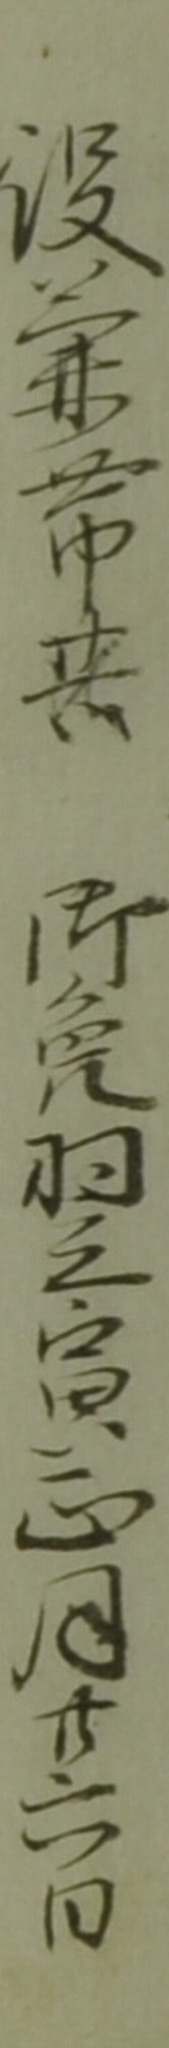役兼帯共御免翌寅正月廿六日
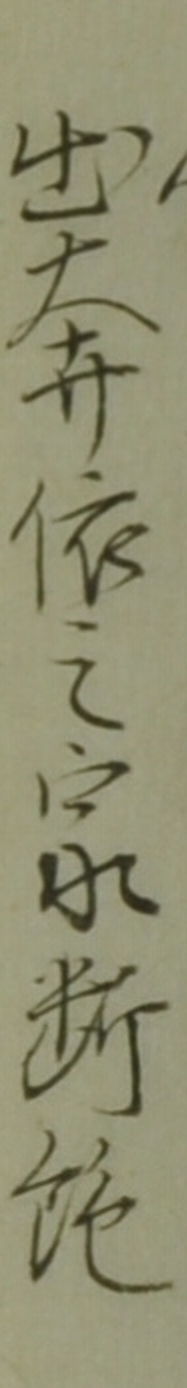出奔依之家断絶

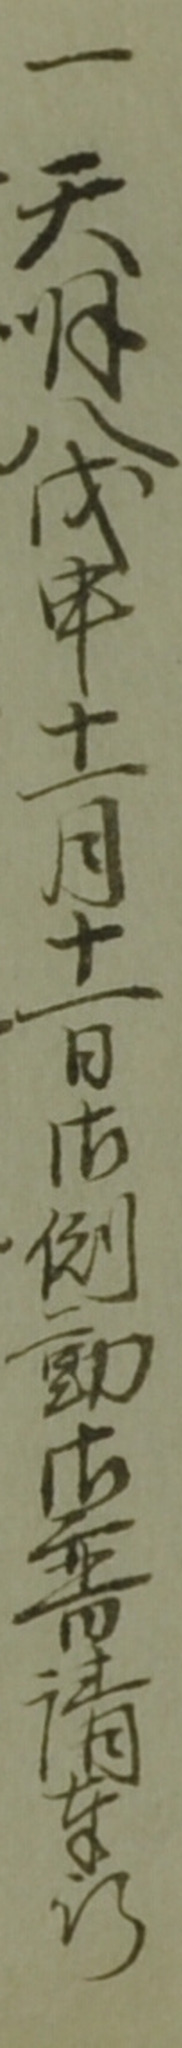一天明八戊申十一月十一日御側勤御普請奉行
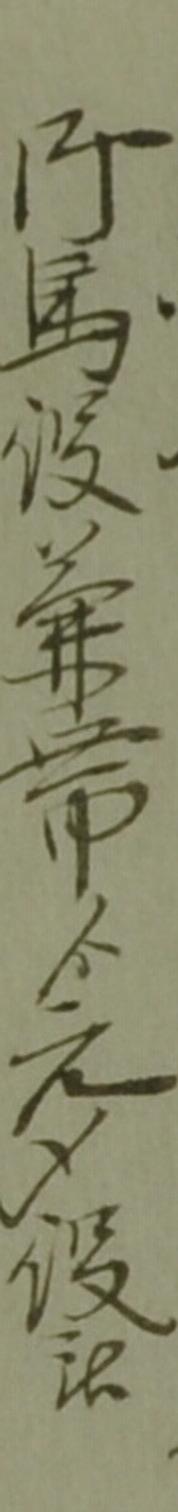御馬役兼帯ゟ元〆役被
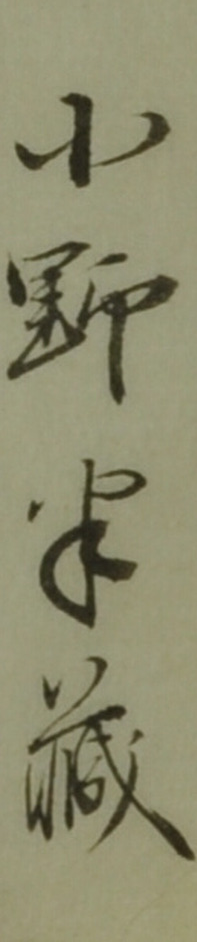小野半蔵
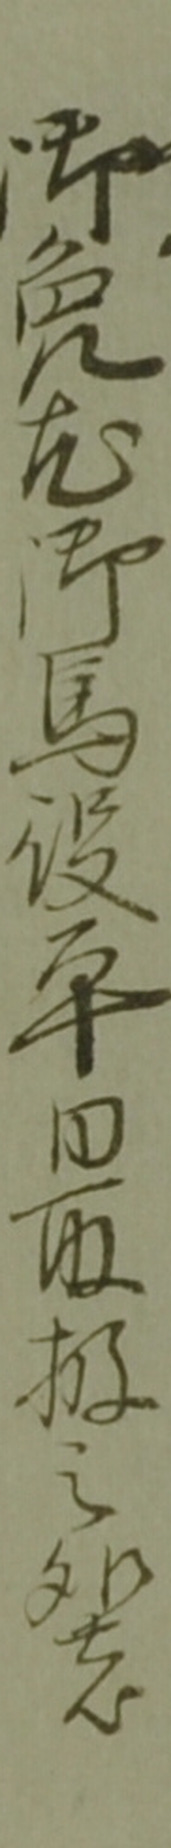御免尤御馬役平日取扱之処者
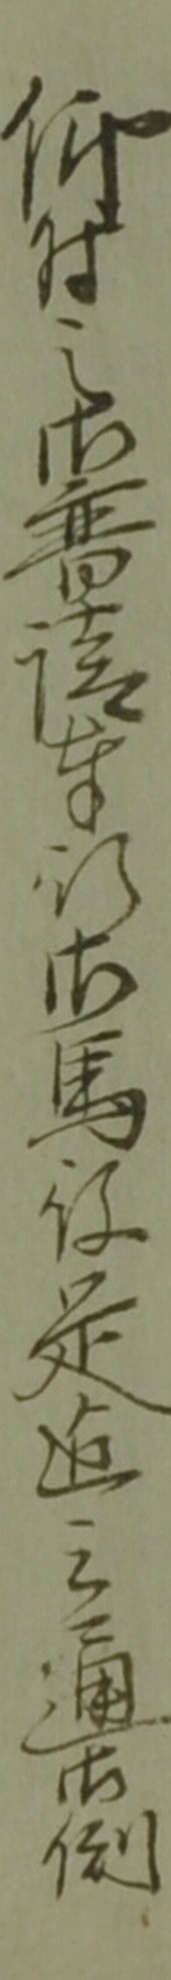仰付之御普請奉行御馬役是迄之通御側
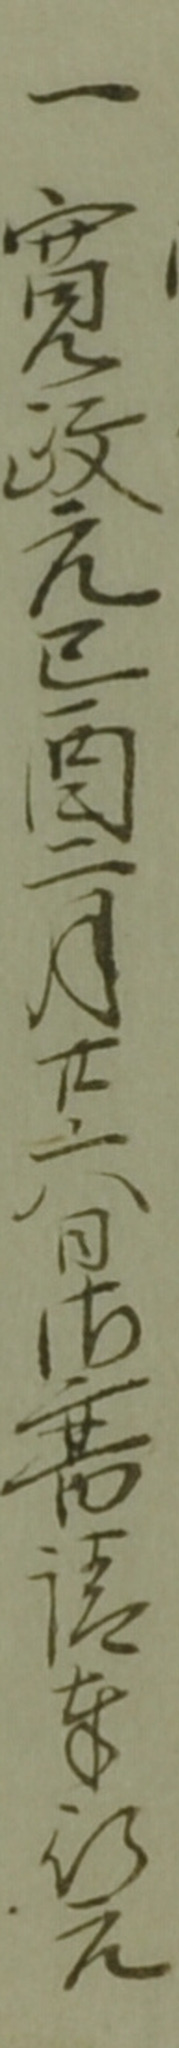一寛政元己酉二月廿肋日御普請奉行元
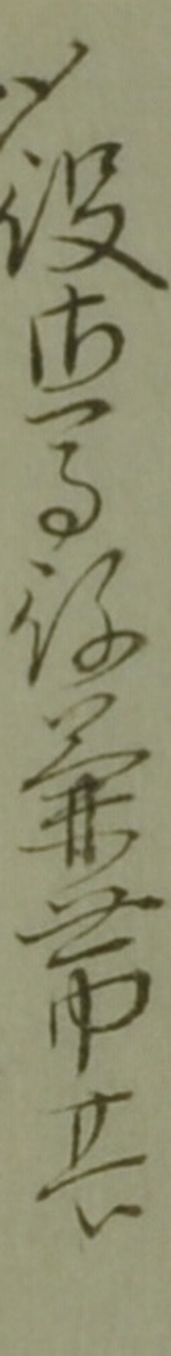〆役御馬役兼帯共
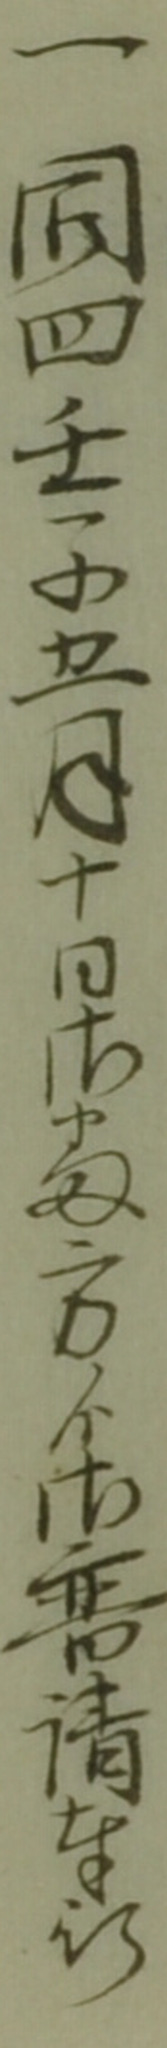一同四壬子五月十日御番方ゟ御普請奉行
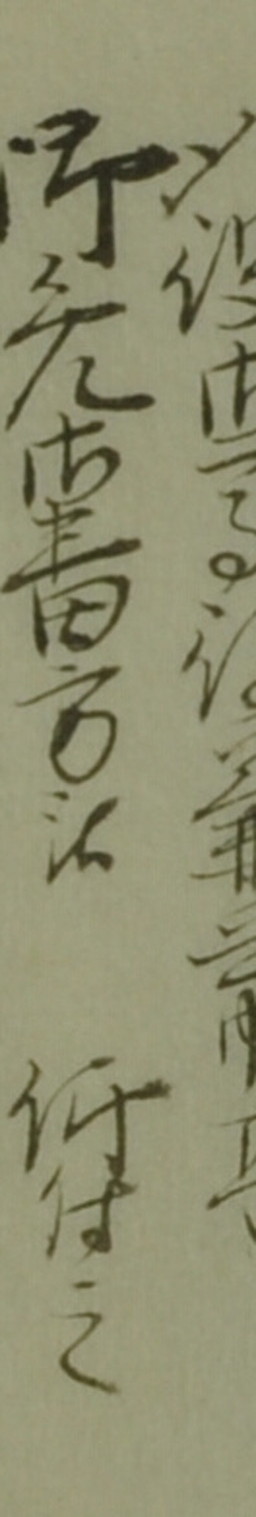御免御番方被仰付之
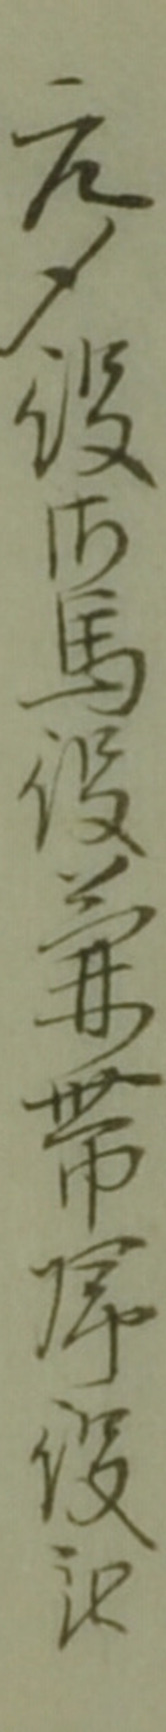元〆役御馬役兼帯帰役被
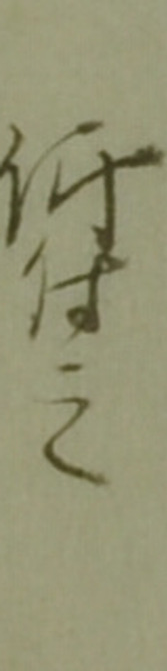仰付之
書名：諸御役代々録（七）
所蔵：伊那市立高遠町図書館・合同会社AMANE
